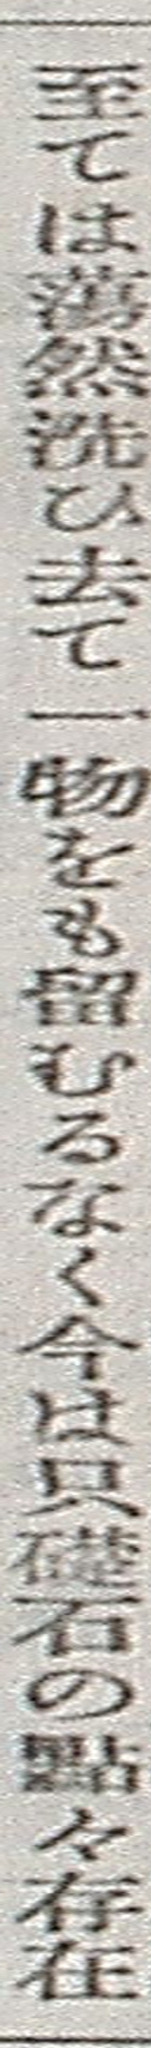至ては蕩然洗ひ去て一物をも留むるなく今は只礎石の点々存在
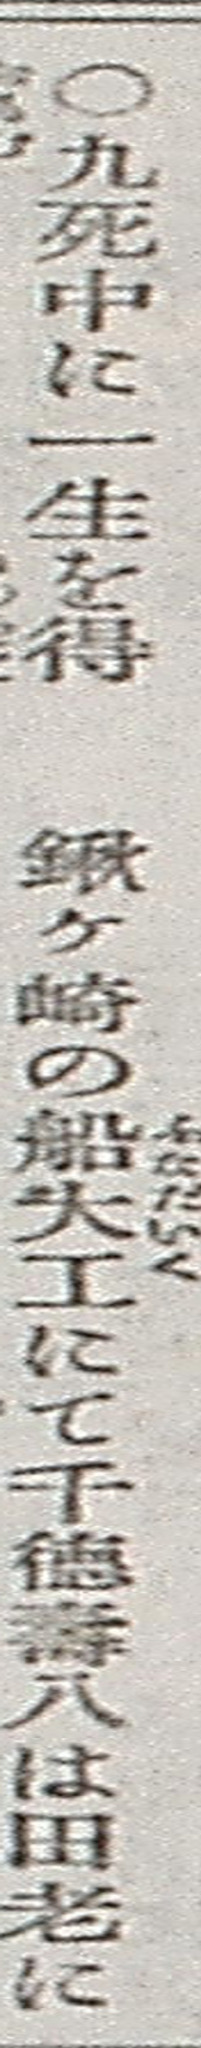○九死中に一生を得鍬ヶ崎の船大工にて千徳壽八は田老に
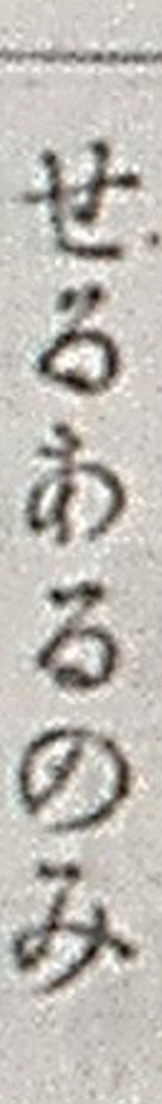せるあるのみ
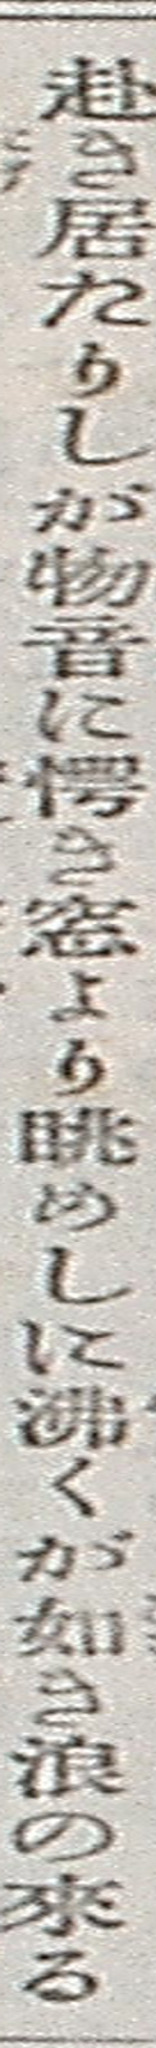赴き居たりしが物音に愕き窓より眺めしに沸くが如き浪の来る
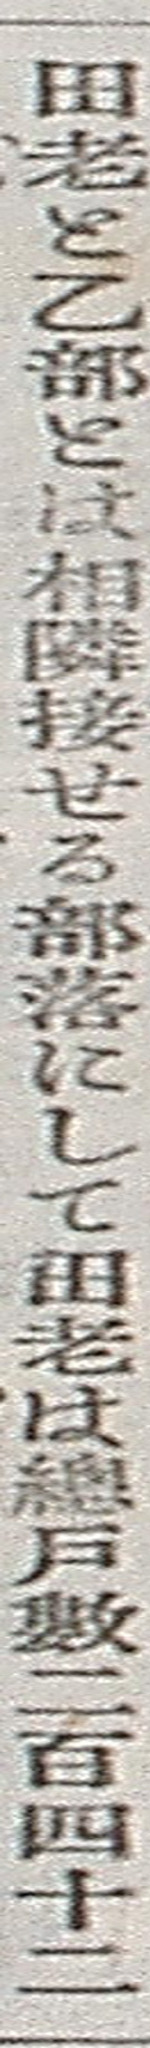田老と乙部とは相隣接せる部落にして田老は総戸数ニ百四十二
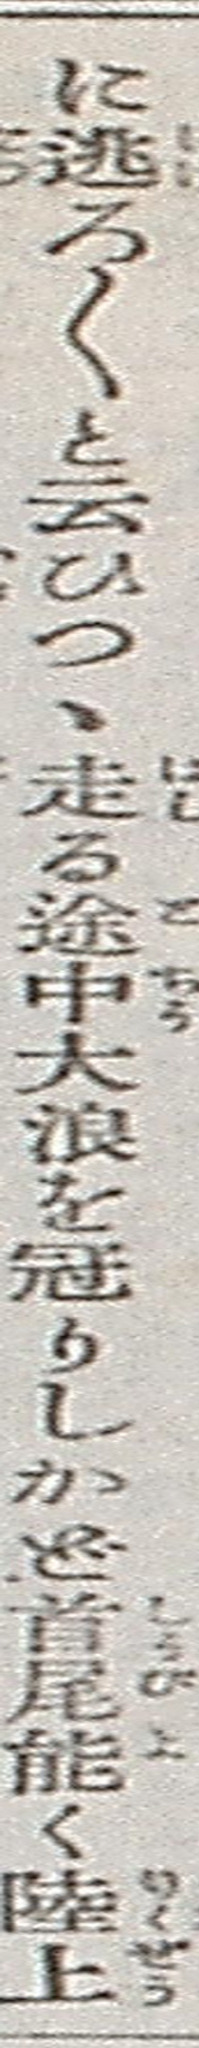に逃ろ〳〵と云ひつゝ走る途中大浪を冠りしかど首尾能く陸上
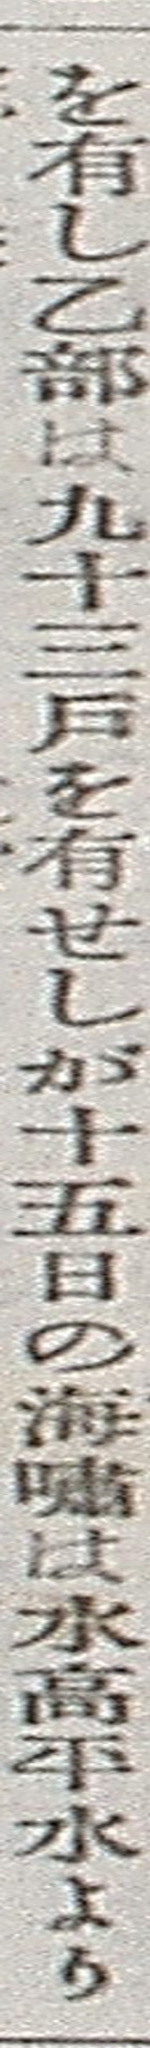を有し乙部は九十三戸を有せしが十五日の海嘯は水高平水より
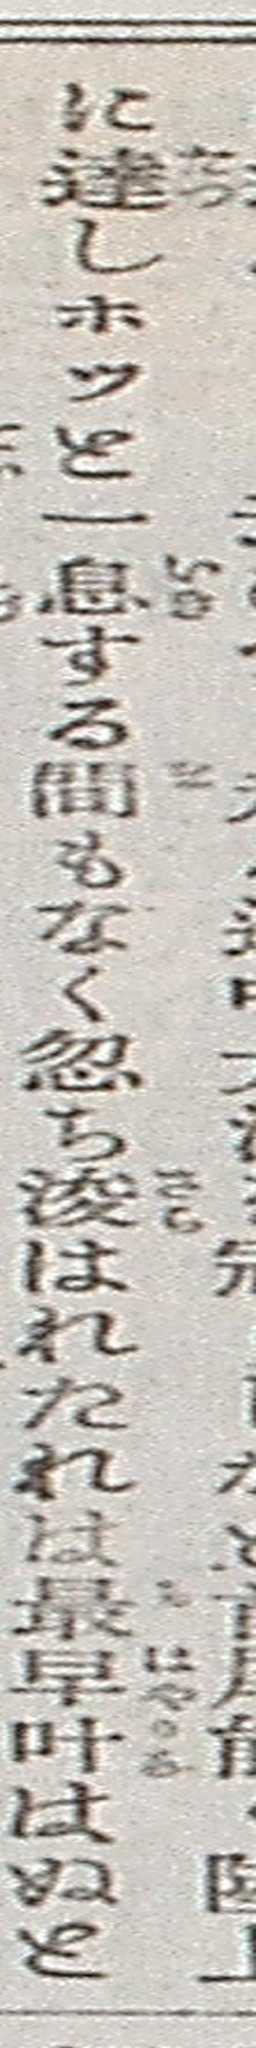に達しホッと一息する間もなく忽ち浚はれたれば最早叶はぬと
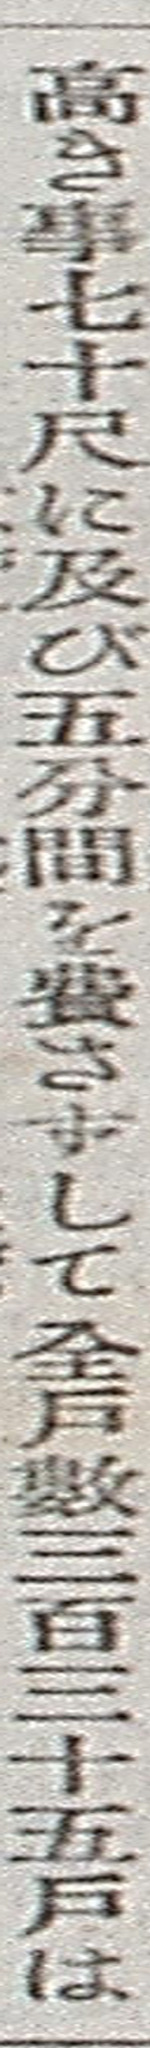髙き事七十尺に及び五分間を費さずして全戸数三百三十五戸は
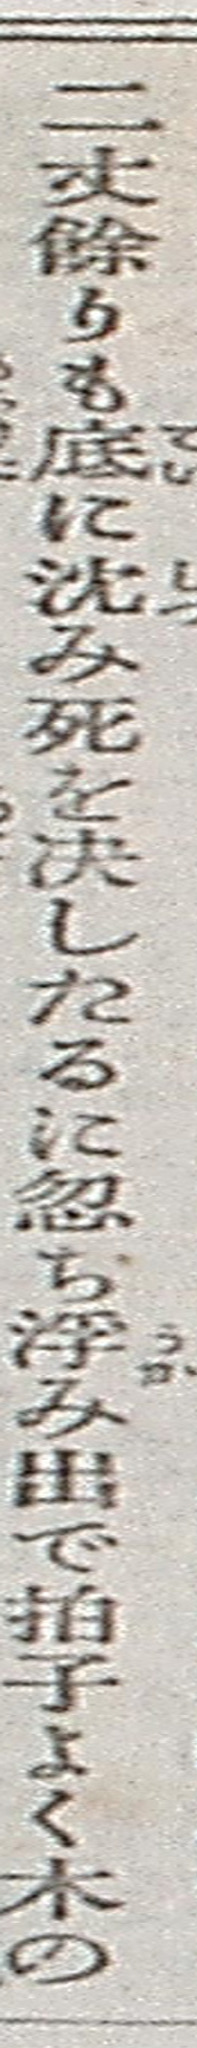二丈余りも底に沈み死を決したるに忽ち浮み出で拍子よく木の
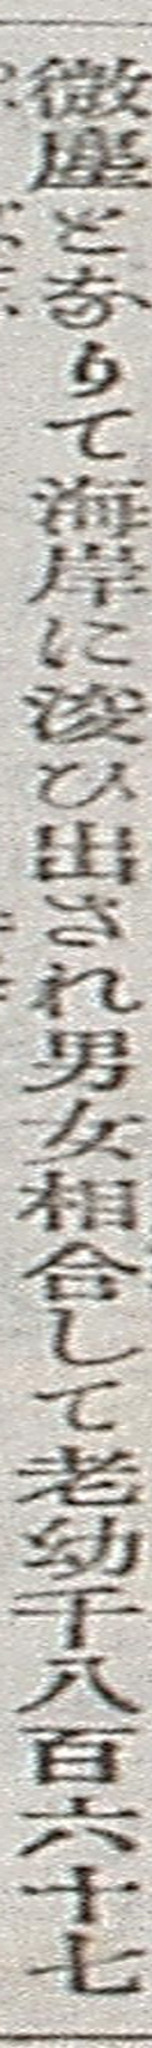微塵となりて海岸に浚ひ出され男女相合して老幼千八百六十七
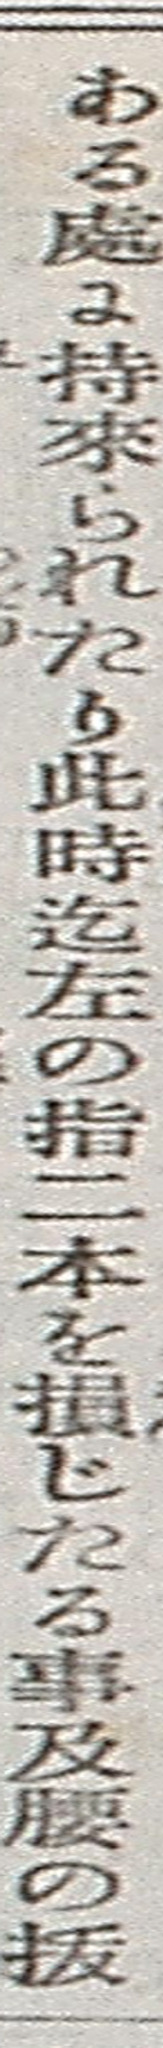ある処に持来られたり此時迄左の指日本を損じたる事及腰の抜
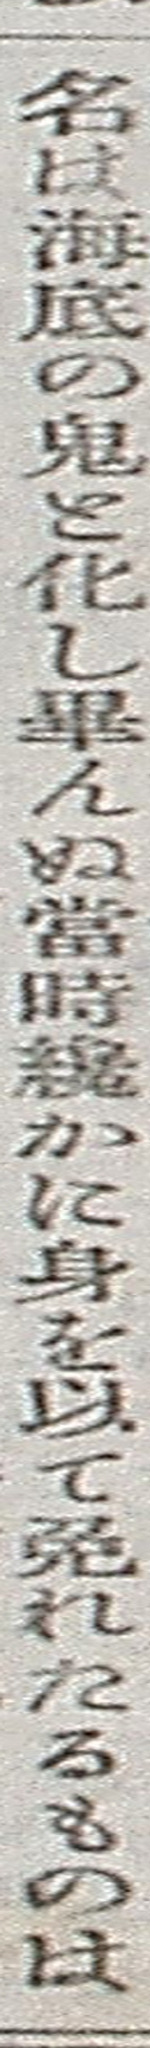名は海底の鬼と化し畢んぬ当時僅かに身を以て免れたるものは
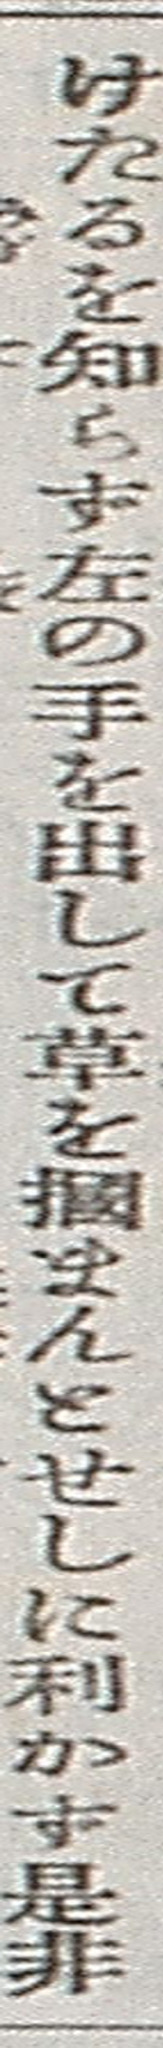けたるを知らず左の手を出して草を掴まんとせしに利かず是非
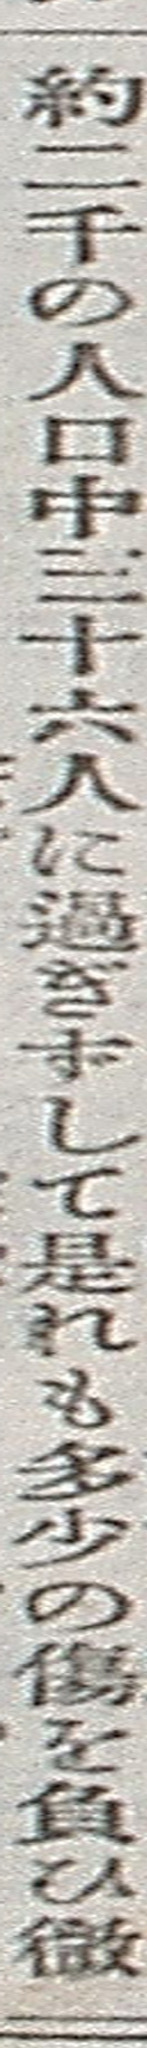約二千の人口中三十六人に過ぎずして是れも多少の傷を負ひ微
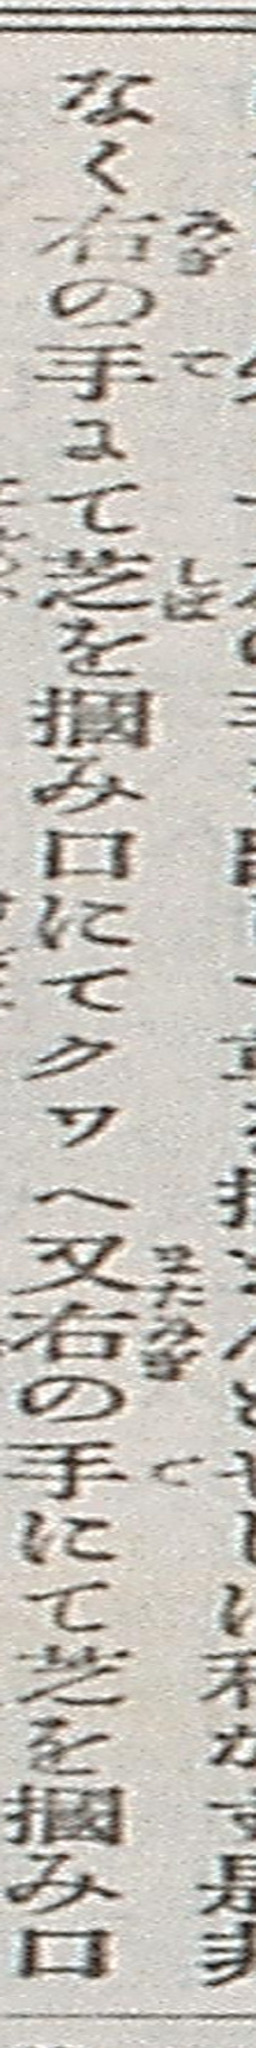なく右の手にて芝を掴み口にてクワへ又右の手にて芝を掴み口
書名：風俗畫報臨時増刊第百二十號　大海嘯被害録（下）
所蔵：東京大学地震研究所図書室 Earthquake Research Institute Library, The University of Tokyo, JAPAN
